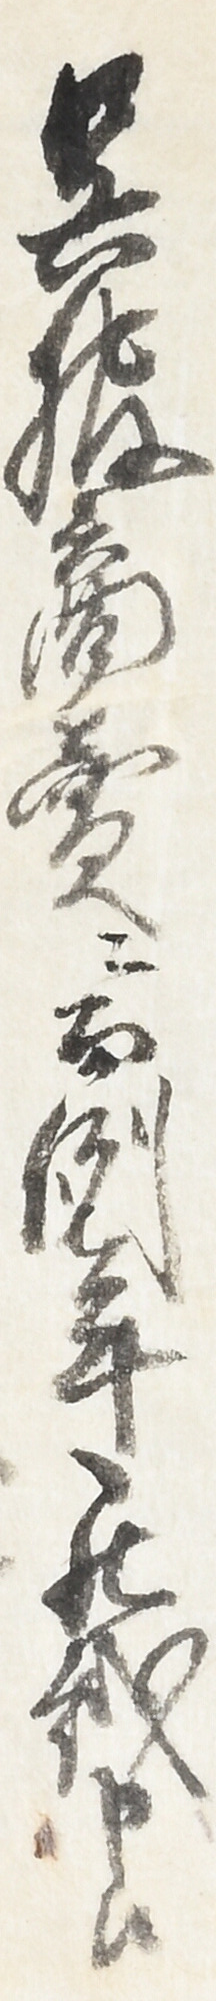呉服商売ニ而例年罷越申候
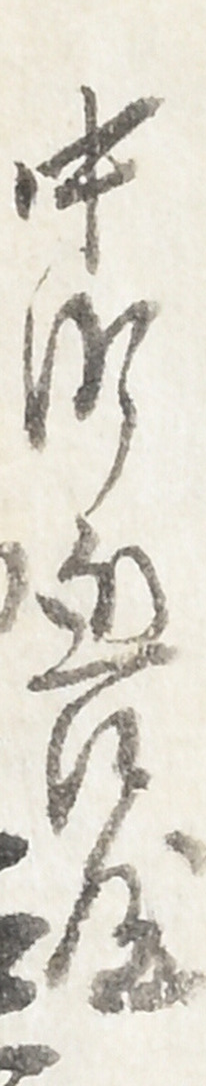中町近江屋
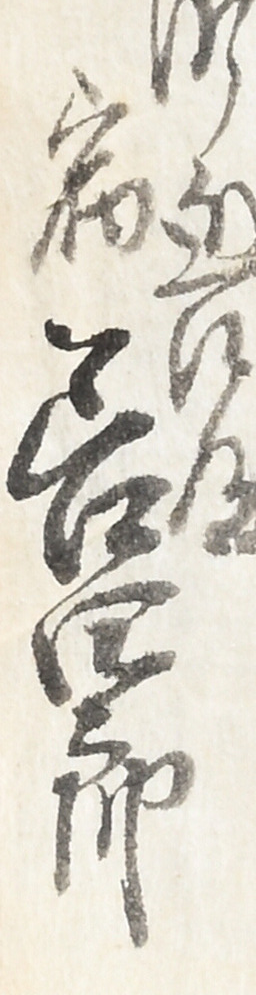宿善四郎

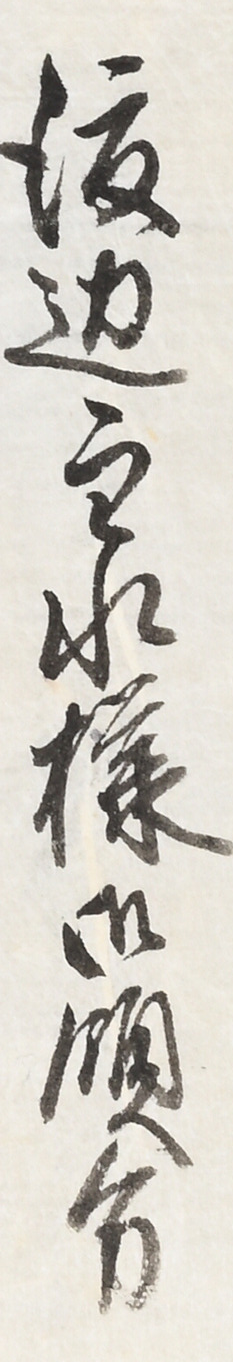渡辺主水様御領分
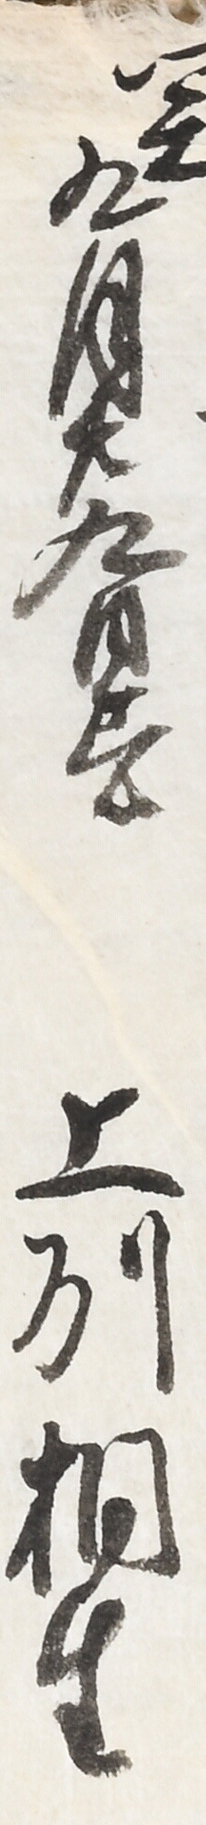九月廿九日着上州相生
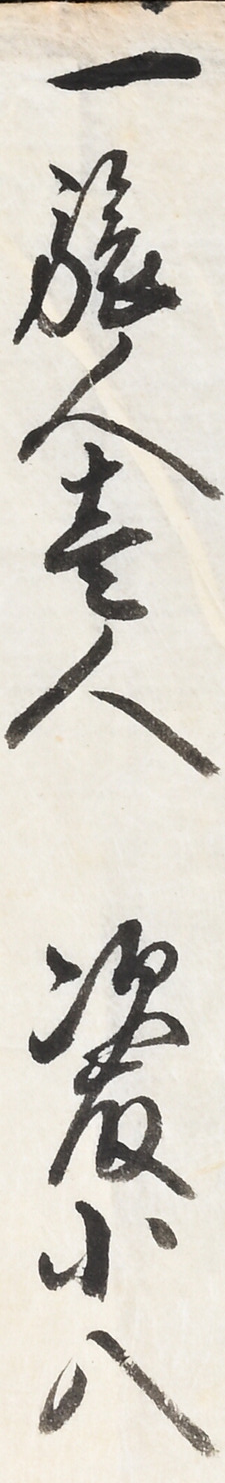一旅人壱人次藤小八
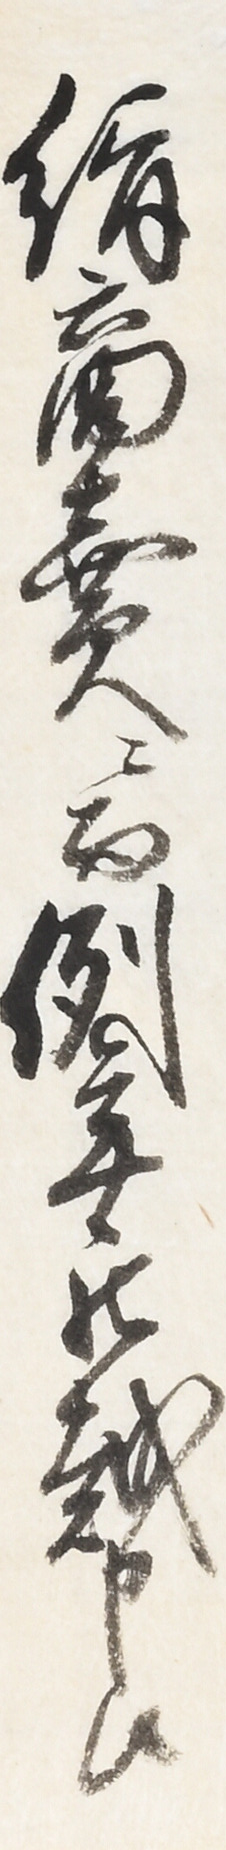絹商売ニ而例年罷越申候
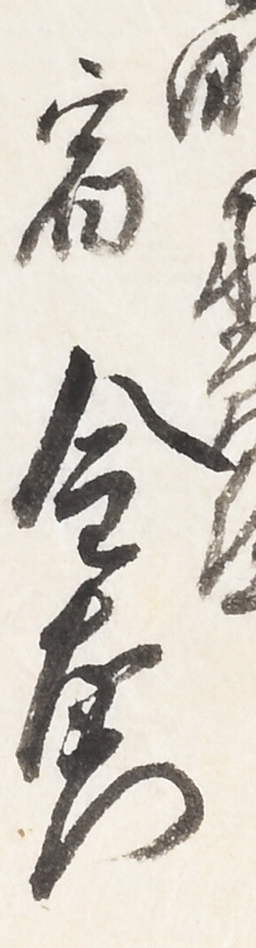宿金右衛門
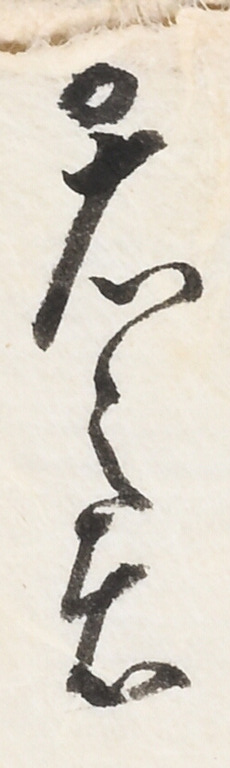〇右之者
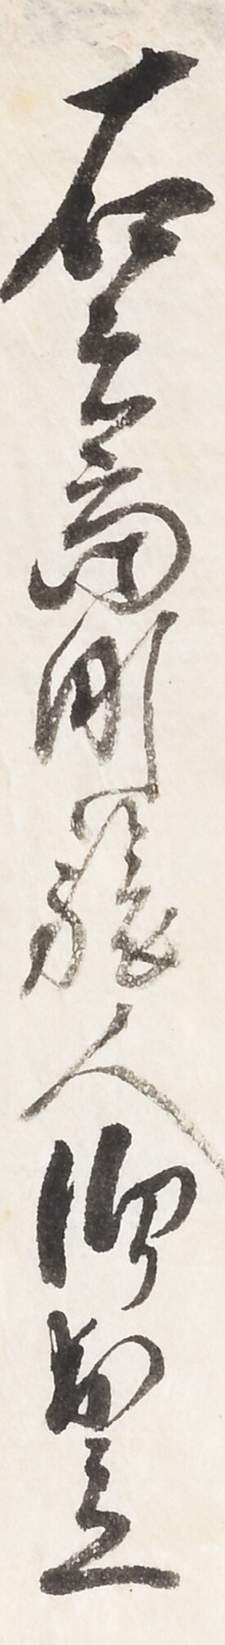右者当町旅人泊リ出立
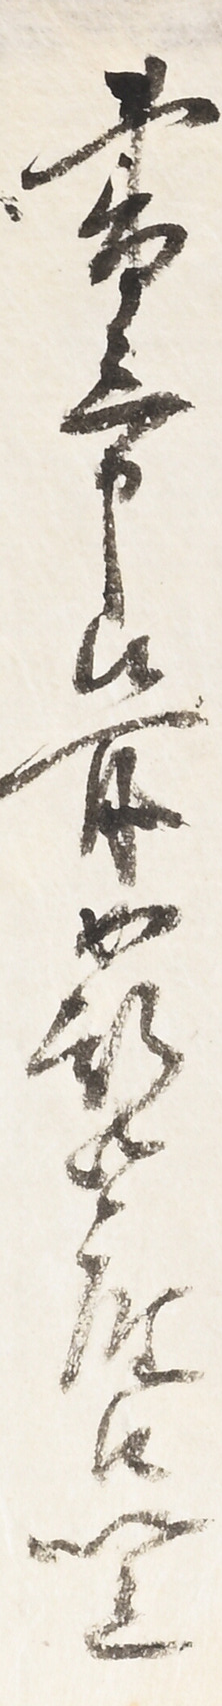書上申候所如斯御座候以上
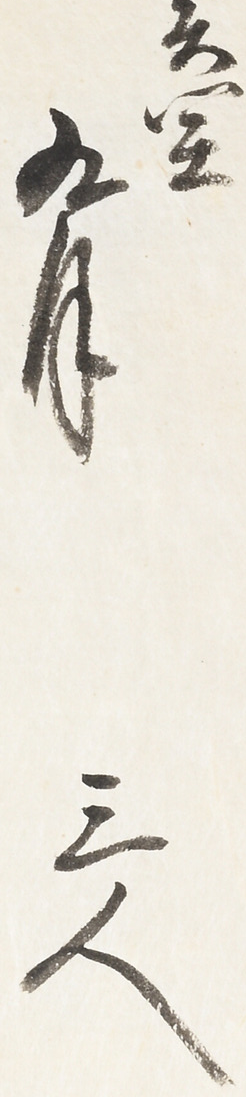九月三人

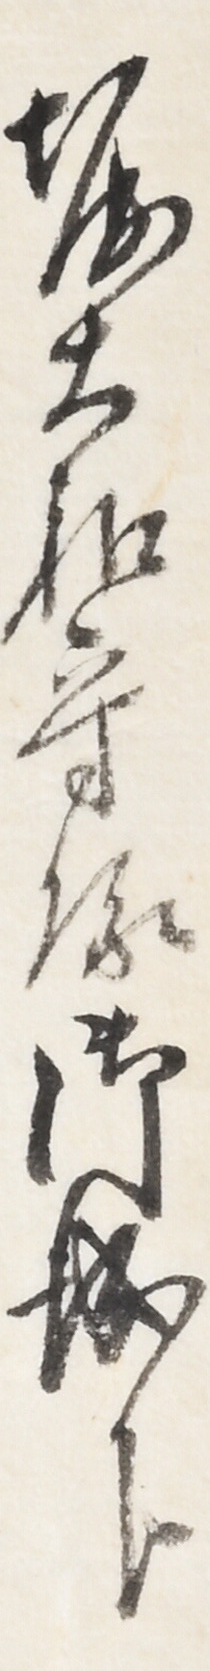堀大和守様御城下
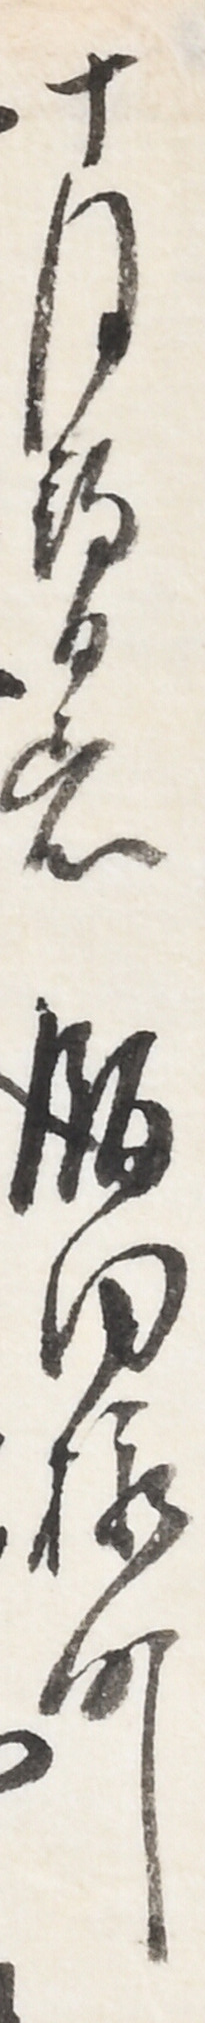十月朔日着飯田桜町
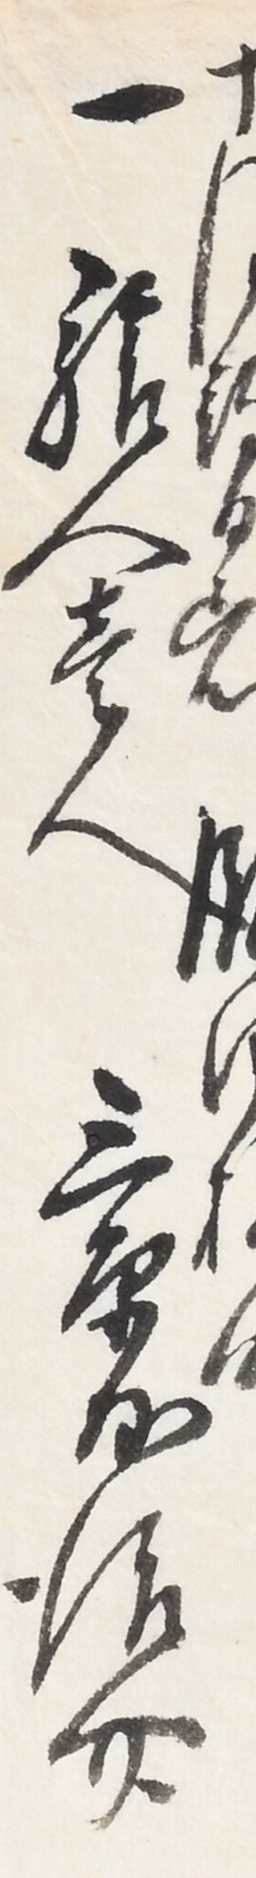一旅人壱人三原屋治介
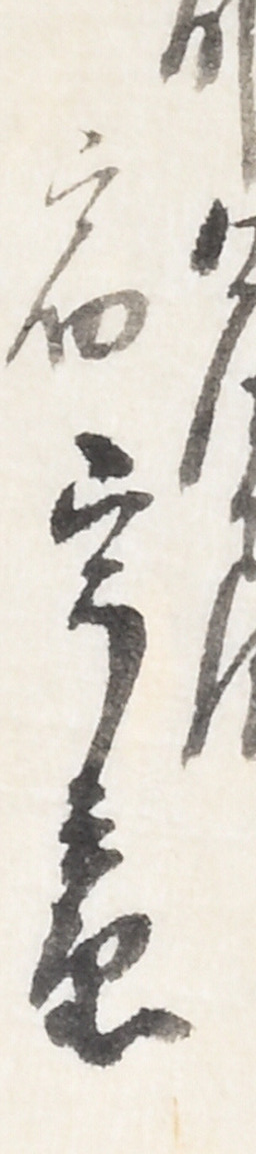宿宇兵衛
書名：旅人泊控帳
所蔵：伊那市立高遠町図書館・合同会社AMANE
